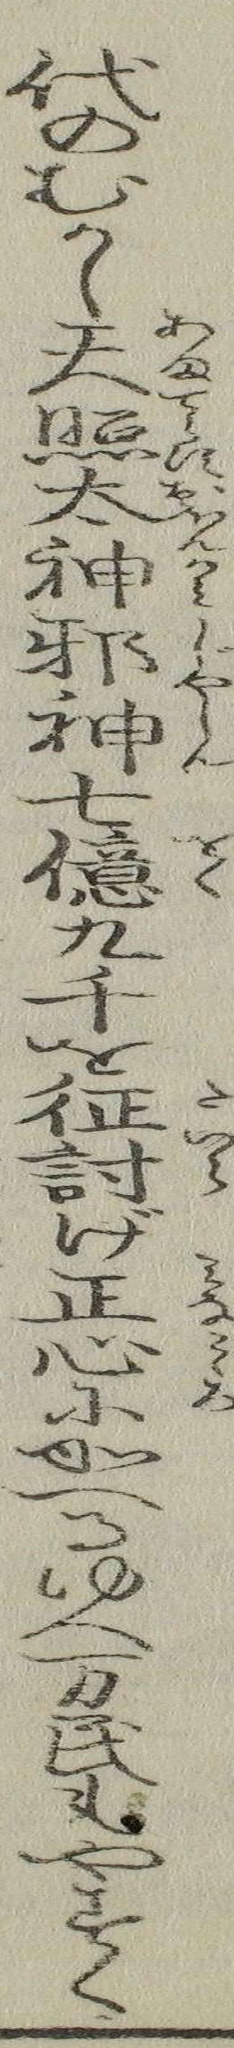代のむかし天照太神邪神七億九千を征討げ正心にかへるゆへ万民もやすく
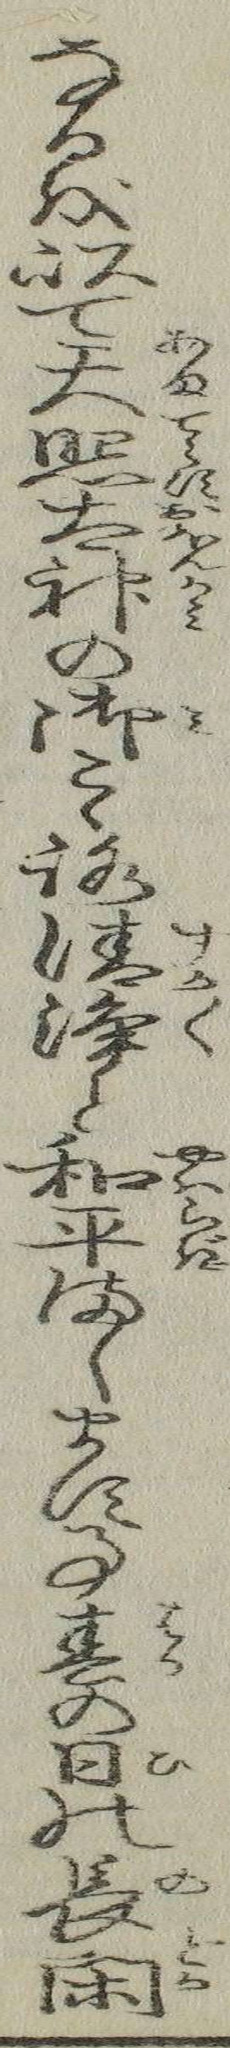なるを以て天照太神の御こゝろ清浄と和平まします事春の日の長閑
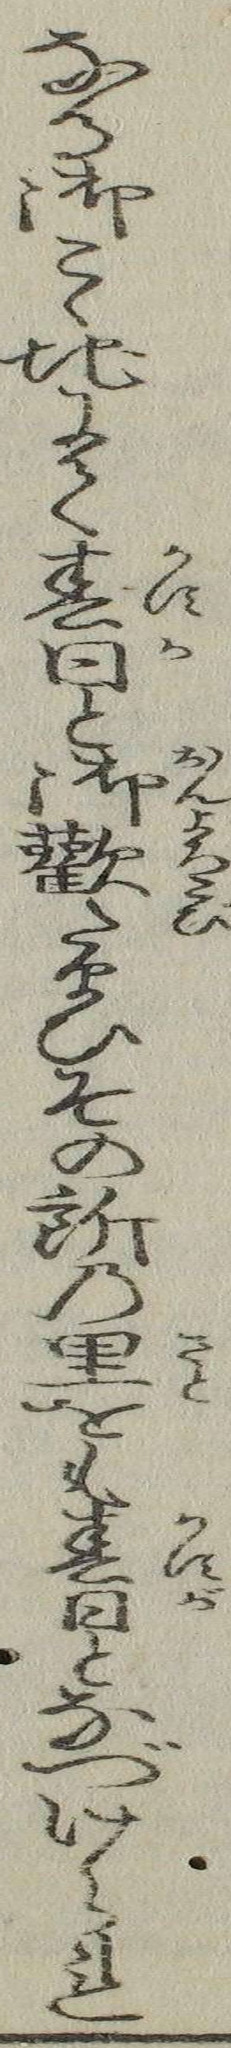なる御こゝ地にて春日と御歡たまひその所の里をも春日となづけられ
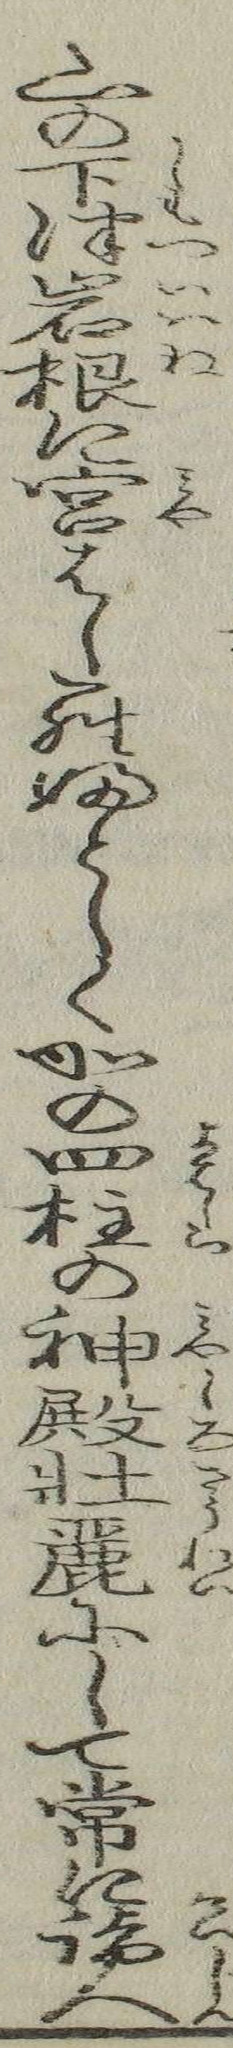山の下津岩根に宮はしらふとしくかの四柱の神殿壯麗にして常に詣人
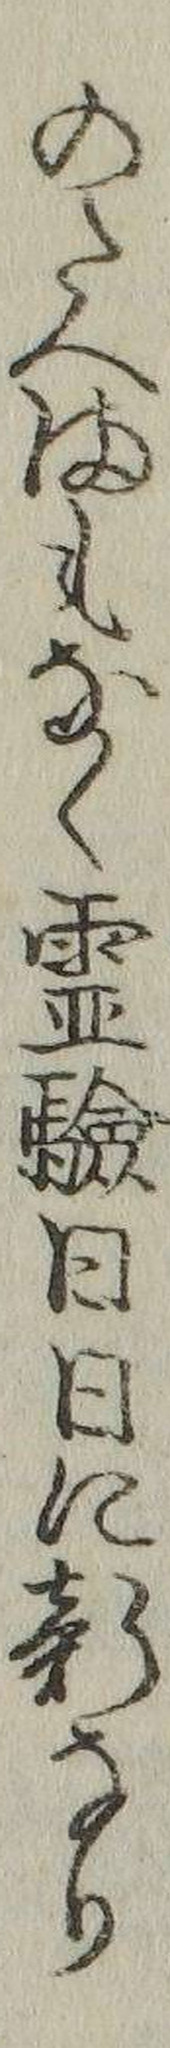のたへまもなく霊驗日日に新なり
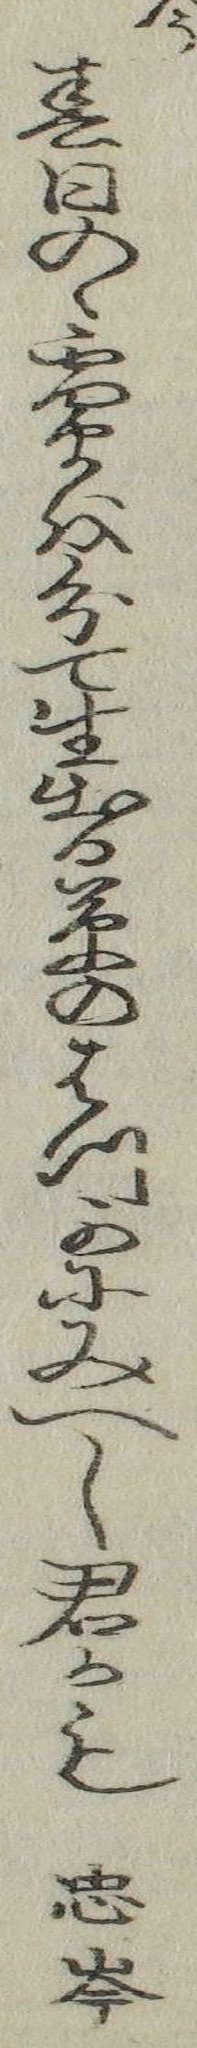春日のゝ雪まを分て生出る草のはつかにみへし君かも忠岑
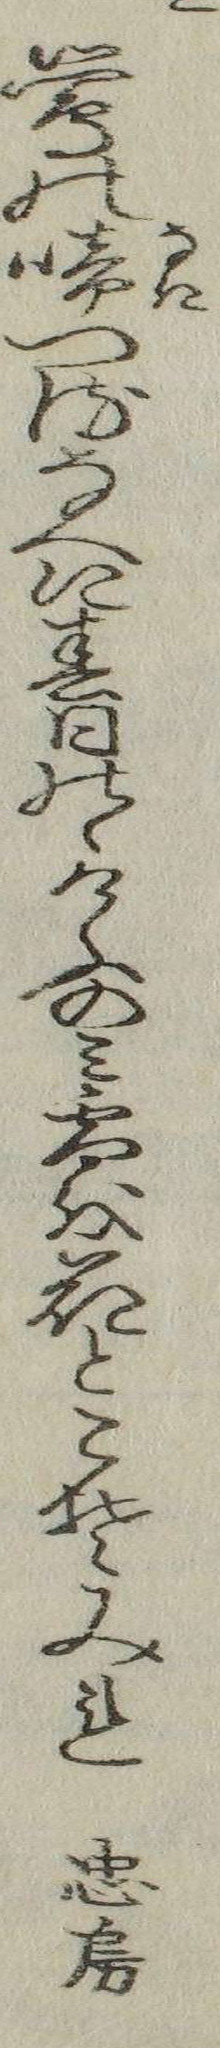鶯の啼つるなへに春日のゝけふのみ雪を花とこそみれ忠房
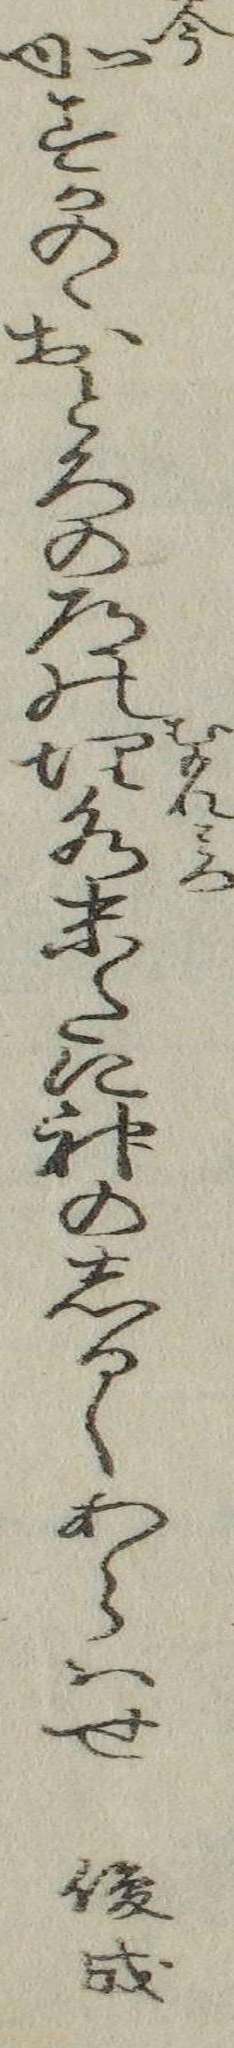かすかのゝおとろの道の埋水末たに神のしるしあらはせ俊成

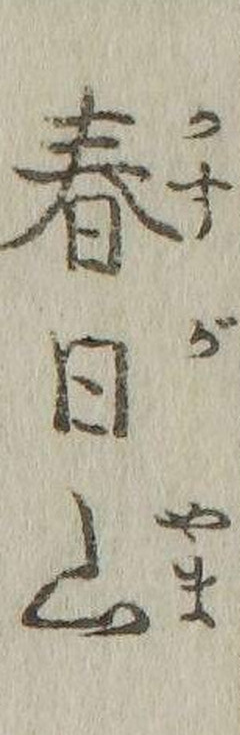春日山
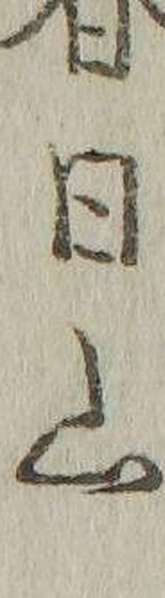春日山
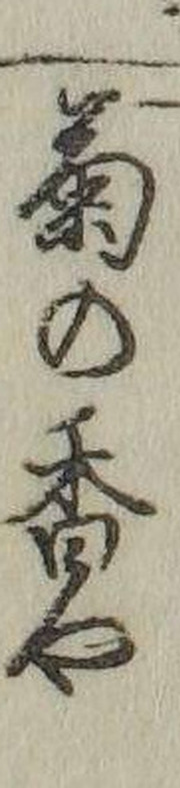菊の香や
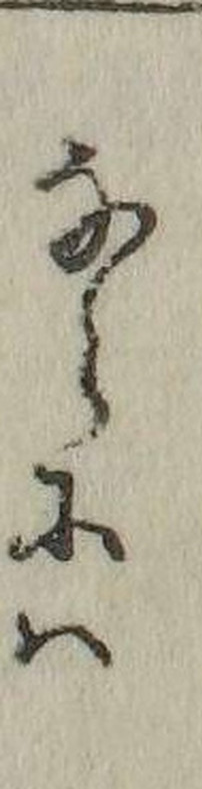ならには

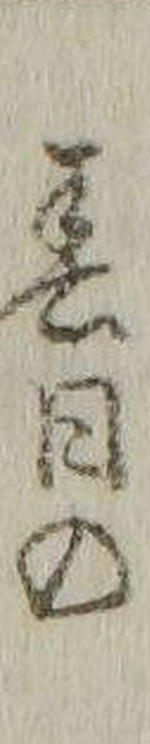春日の
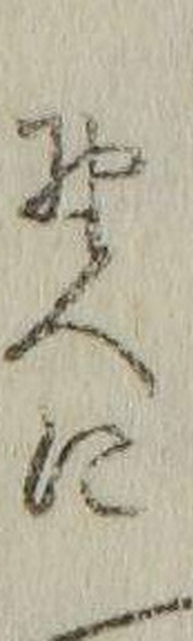野へに
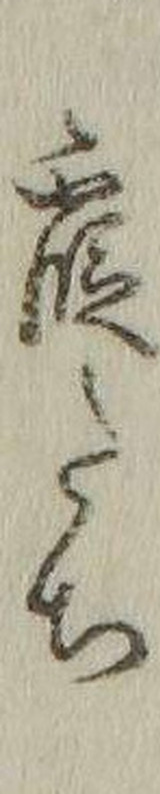霞たち
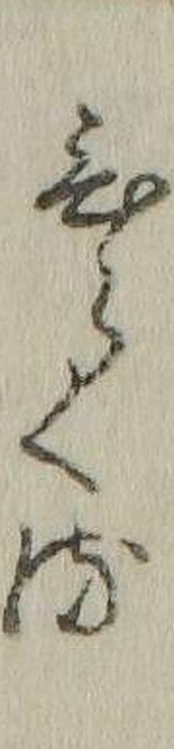ひらくる
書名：大和名所圖會
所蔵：国文学研究資料館
